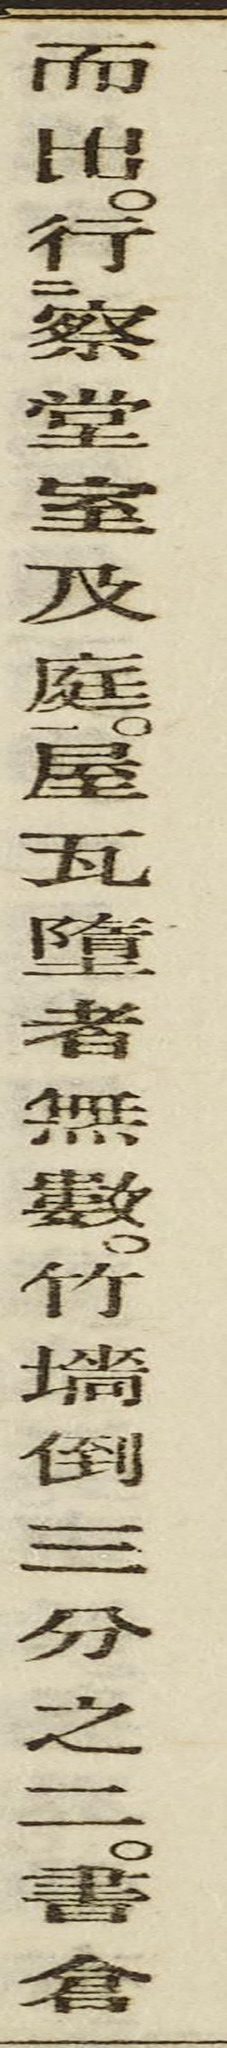而出。行ニ察堂室及庭。屋瓦堕者無数。竹墻倒三分之二。書倉
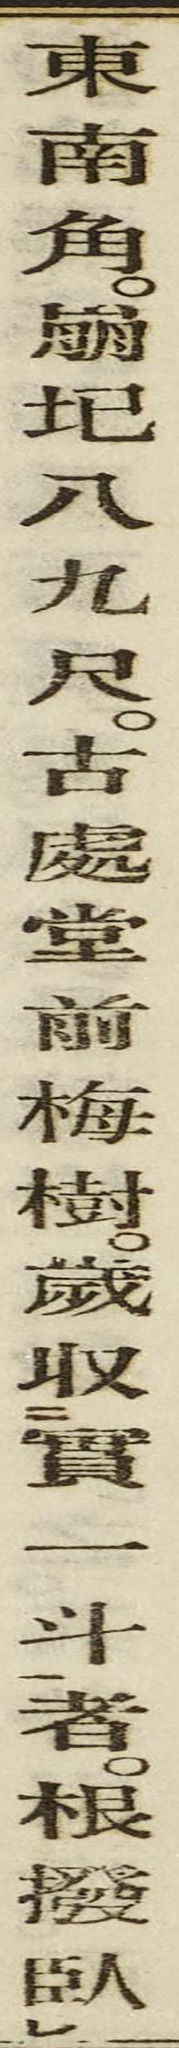東南角。崩圯八九尺。古処堂前梅樹。歳収ニ実一斗者。根撥臥
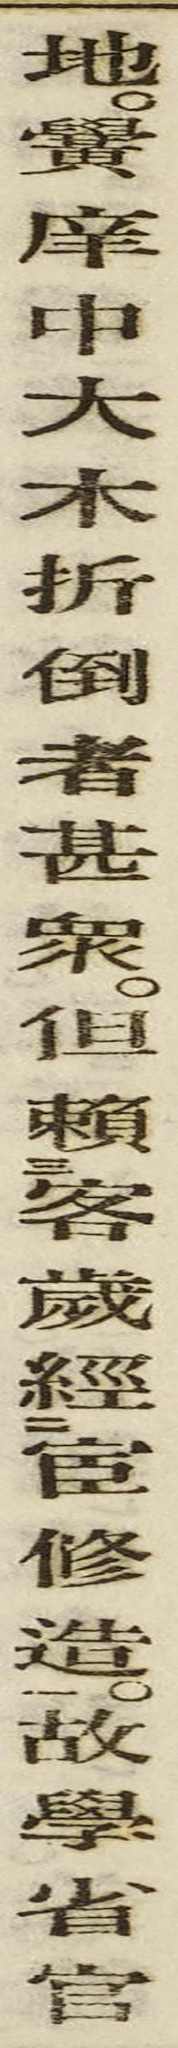地。黌庠中大木折倒者甚衆。但頼客歳経ニ宦修造。故学省官
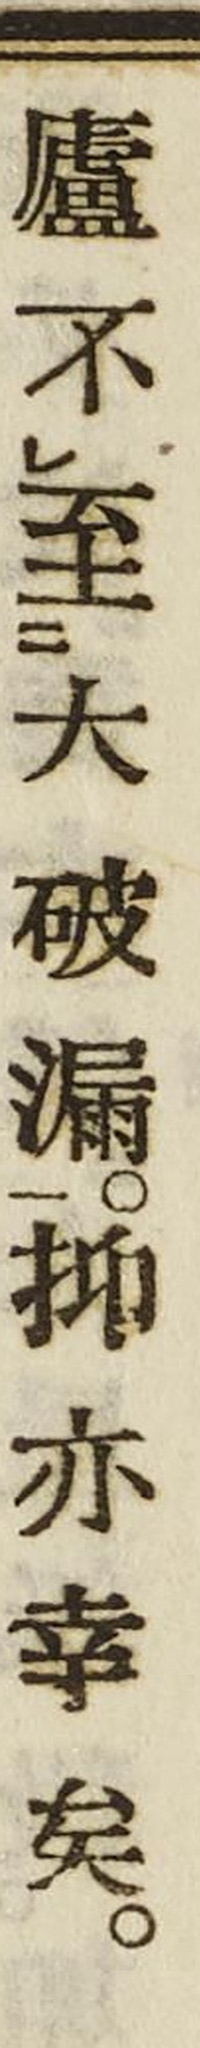盧不至ニ大破漏。抑亦幸矣。
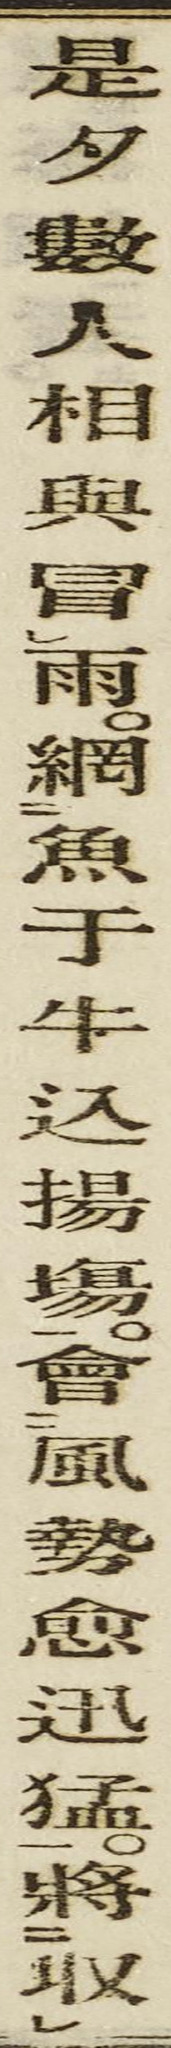是夕数人相与冐雨。網ニ魚于牛込揚場。会ニ風勢愈迅猛。将ニ収
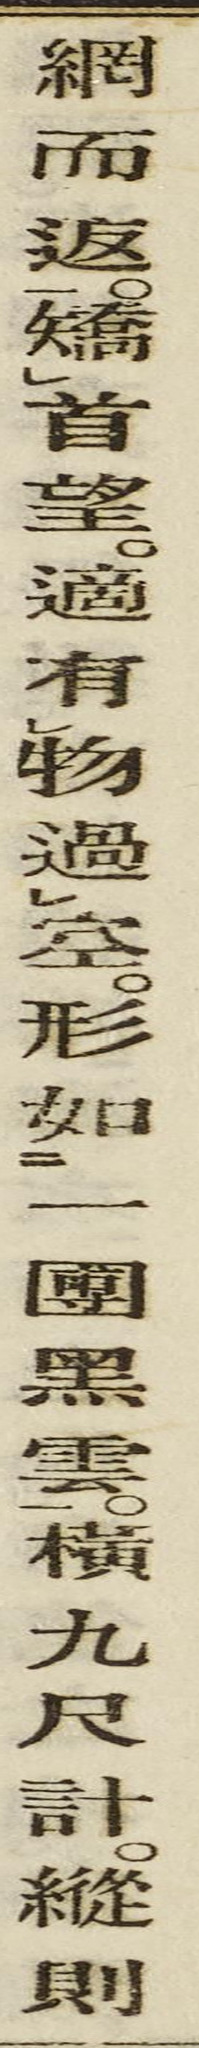網而返。矯首望。適有物過空。形如ニ一団黒雲。横九尺計。縦則
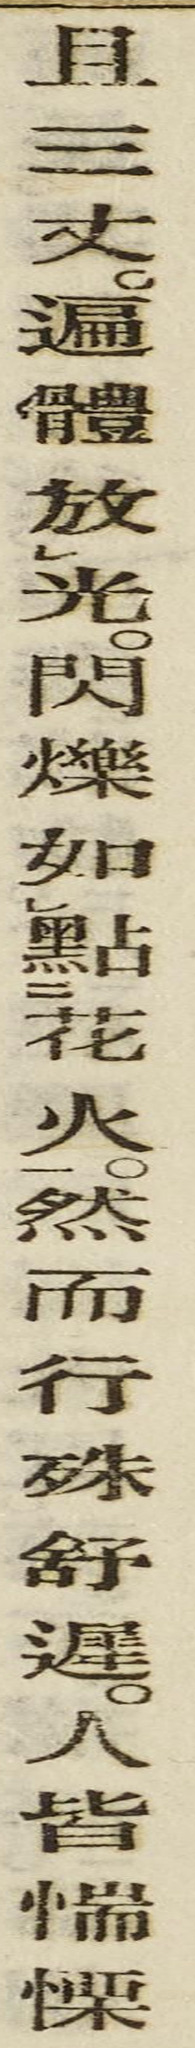且三丈。遍体放光。閃爍如点ニ花火。然而行殊舒遅。人皆惴慄
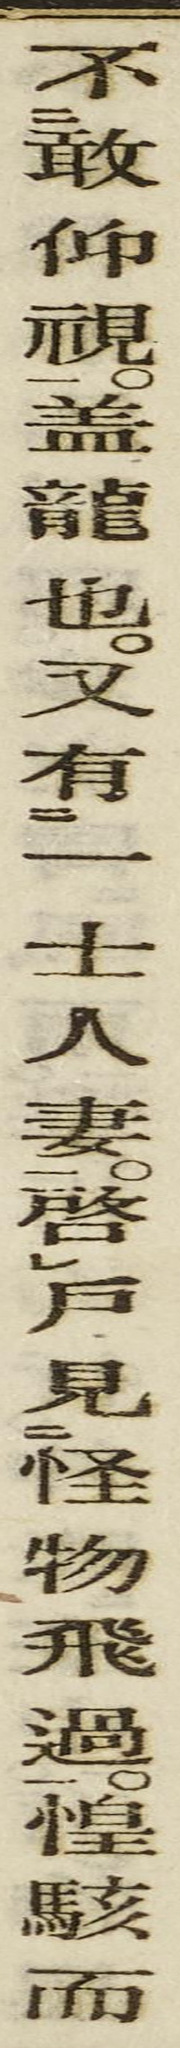不ニ敢仰視。盖龍也。又有ニ一士人妻。啓戸見ニ怪物飛過。惶駭而
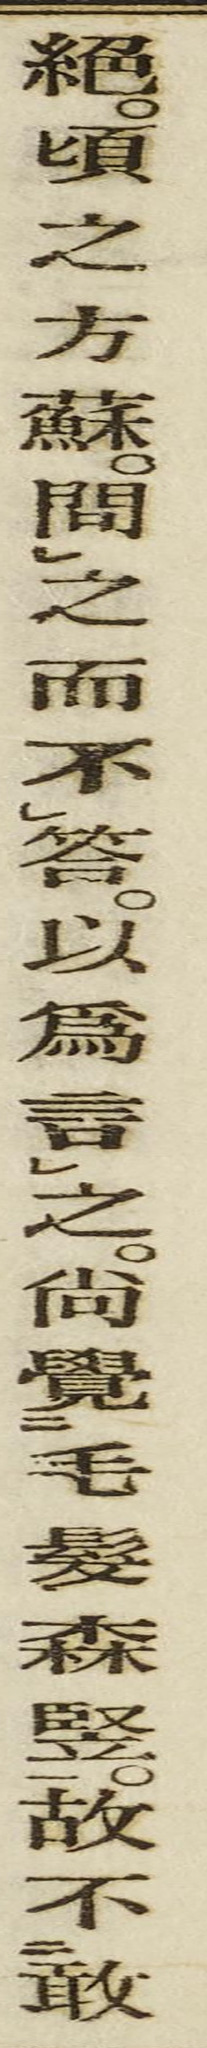絶。頃之方蘇。問之而不答。以為言之。尚覚ニ毛髪森堅。故不ニ敢
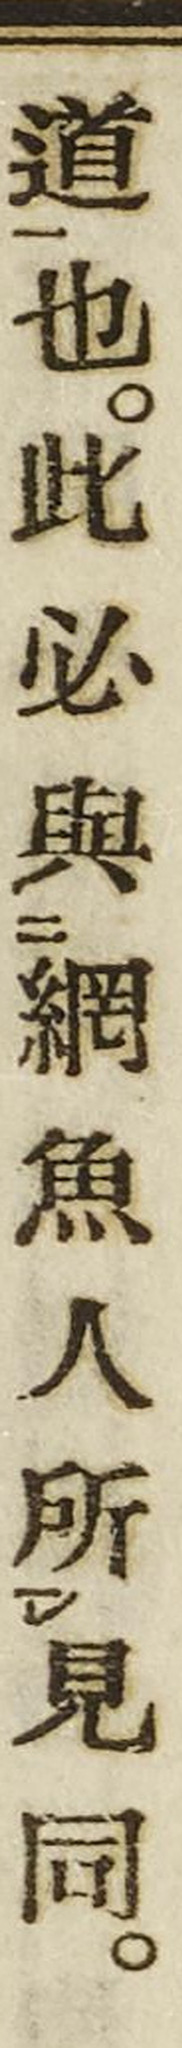道也。此必与ニ網魚人所レ見同。

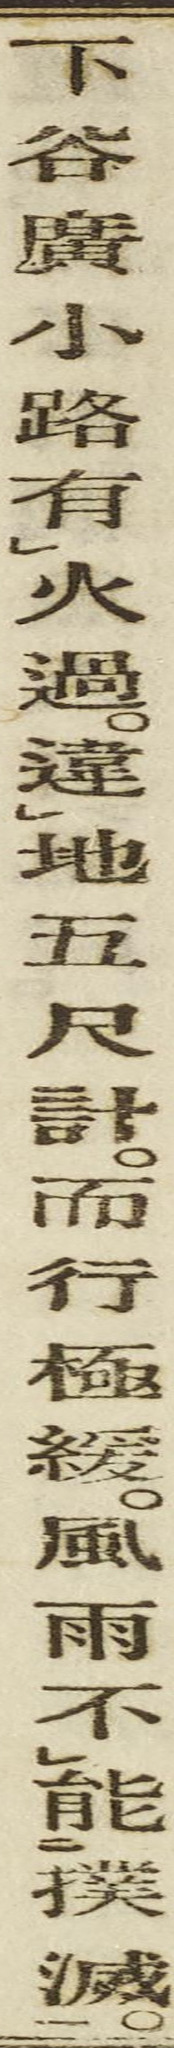下谷池広小路有火過。違地五尺計。而行極緩。風雨不能ニ撲滅。
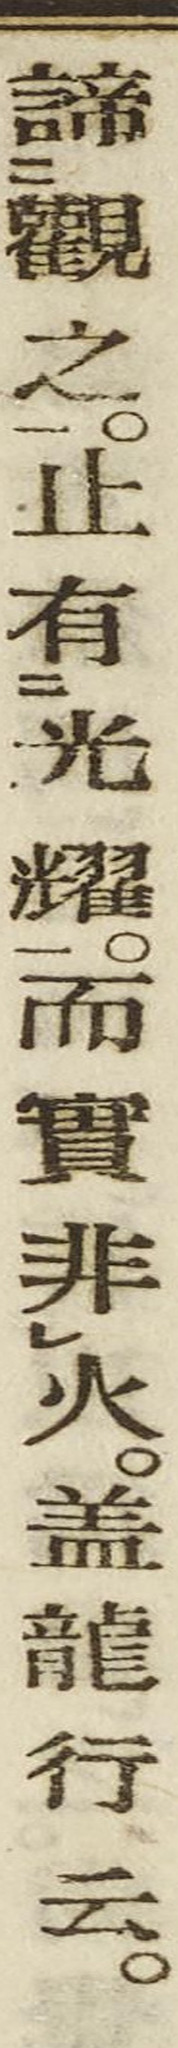諦ニ観之。止有ニ光耀。而実非火。盖龍行云。
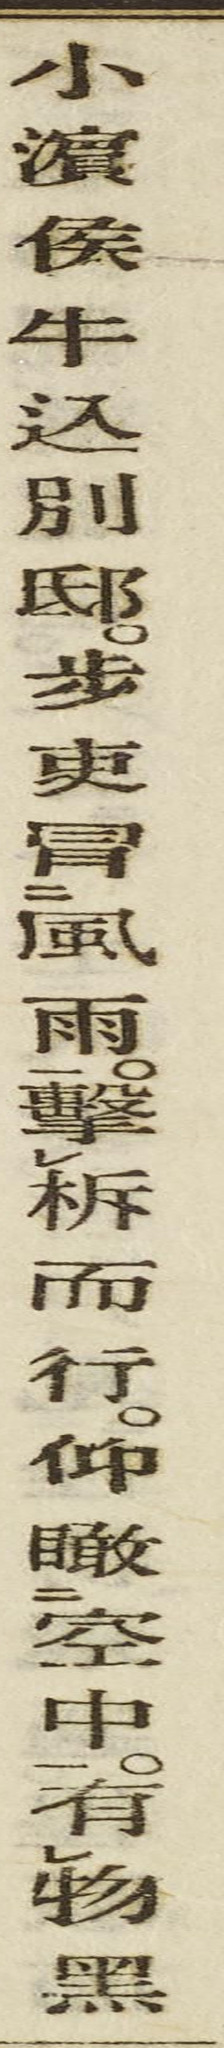小浜侯牛込別邸。歩吏冐ニ風雨。撃析而行。仰瞰ニ空中。有物黒
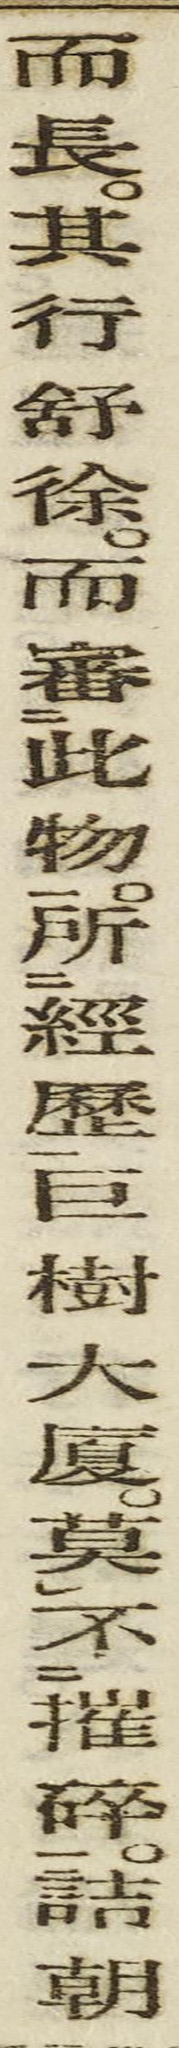而長。其行舒徐。而審ニ此物。所ニ経歴巨樹大厦。莫不ニ摧砕。詰朝
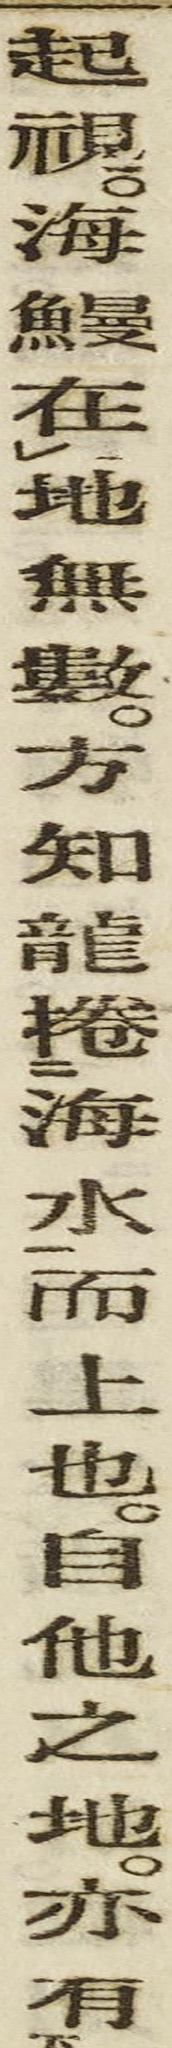起視。海鰻在地無数。方知龍捲ニ海水而上也。自他之地。亦有
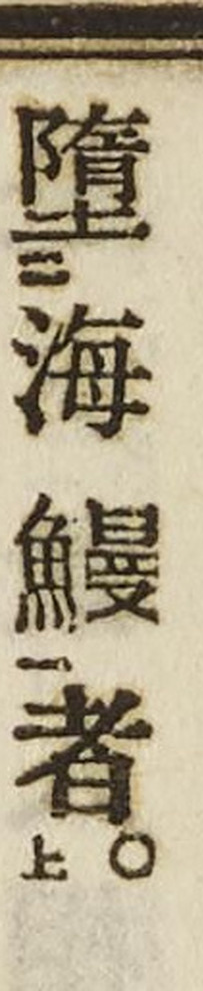堕ニ海鰻者。
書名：史籍集覽　朝鮮陣古文・細井廣澤記・颶風紀事・天明七年將軍宣下次第書　全
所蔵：東京大学地震研究所図書室 Earthquake Research Institute Library, The University of Tokyo, JAPAN
